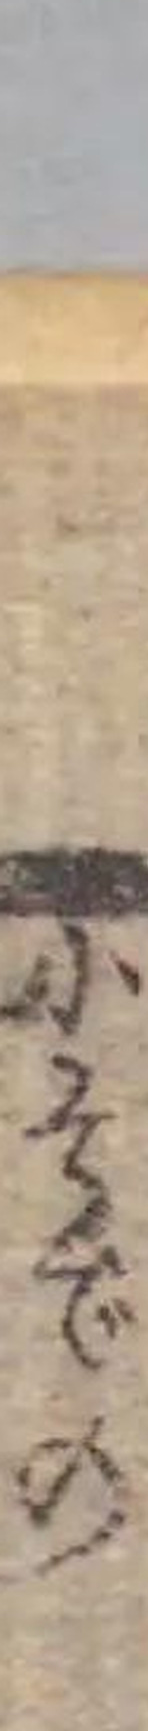こそでの
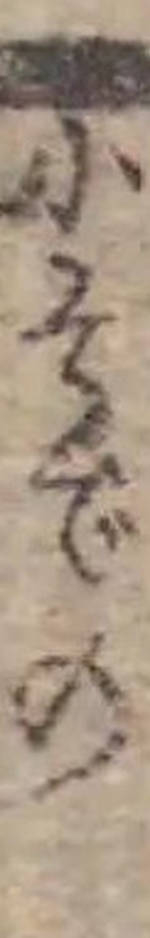こそでの
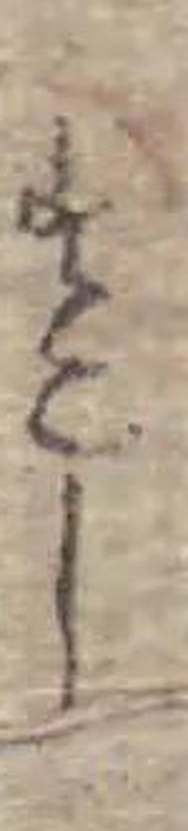すこし
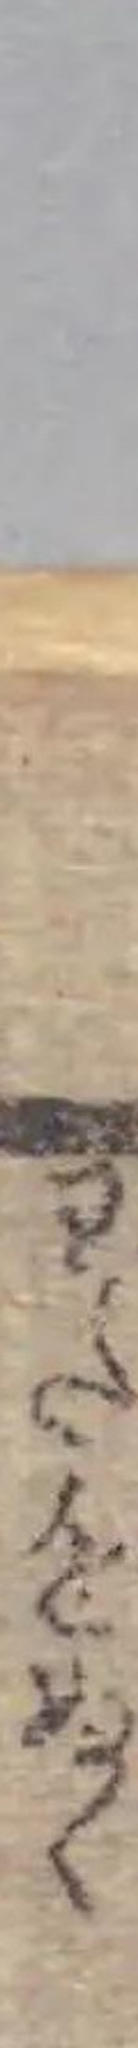わたをぬく
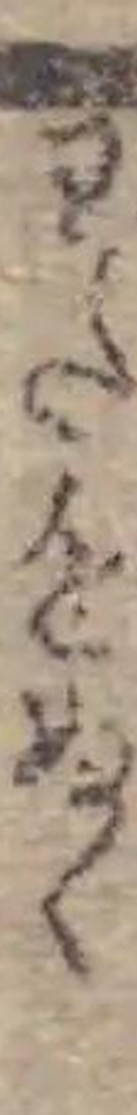わたをぬく
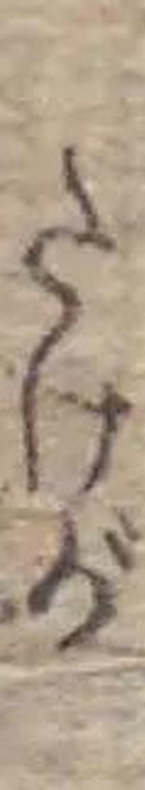たけが
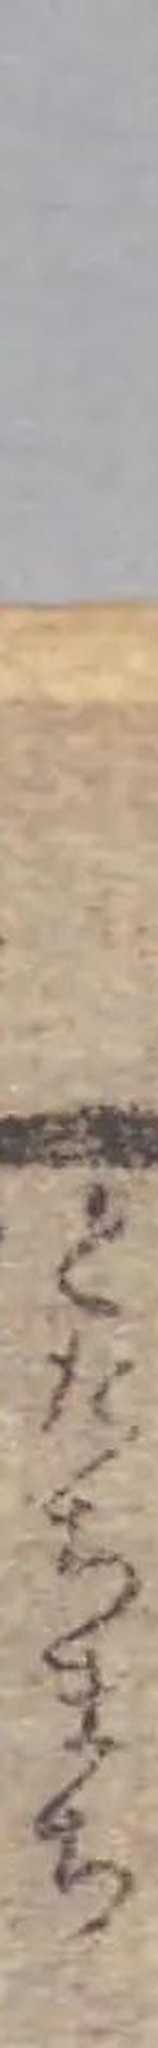とたちまち
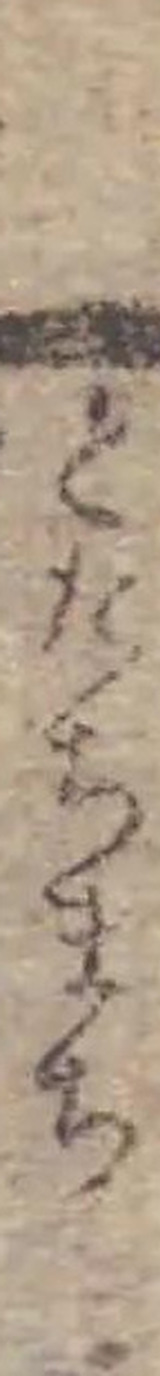とたちまち
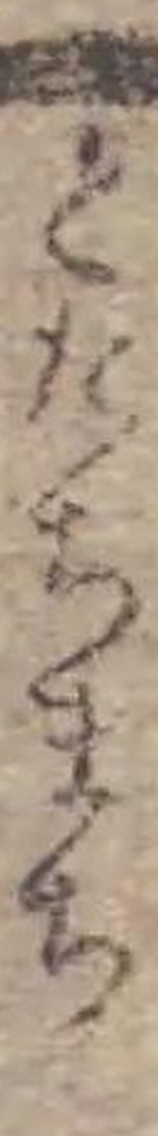とたちまち
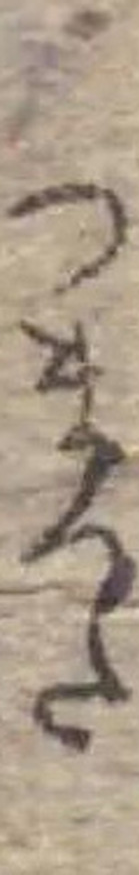つまつた
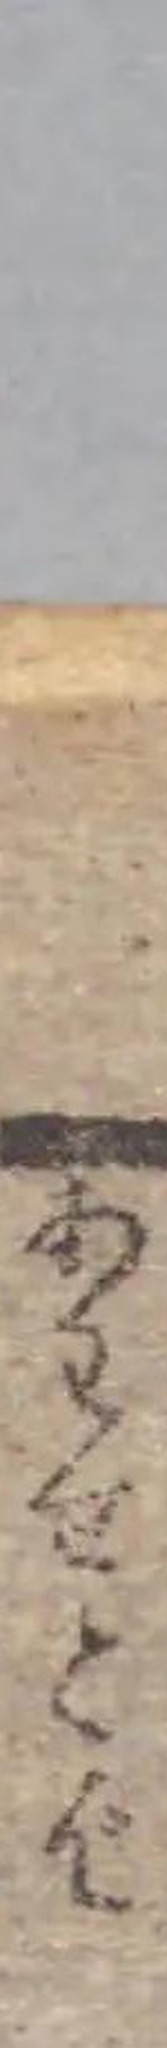あわせとば
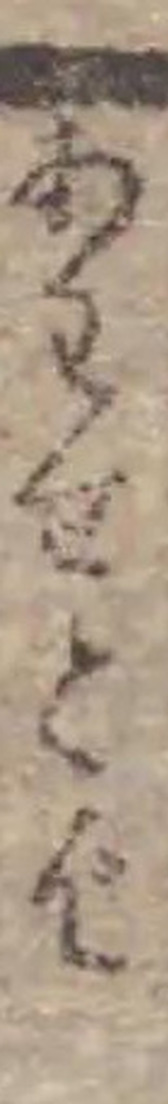あわせとば
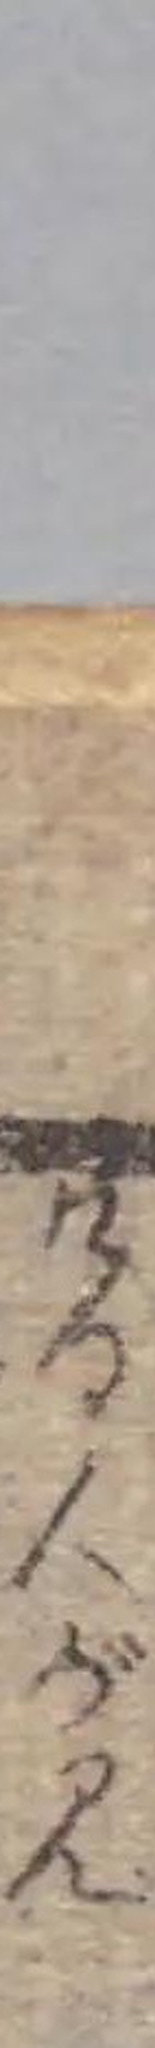ける人が見
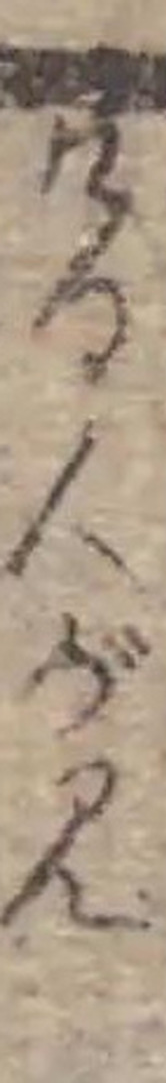ける人が見
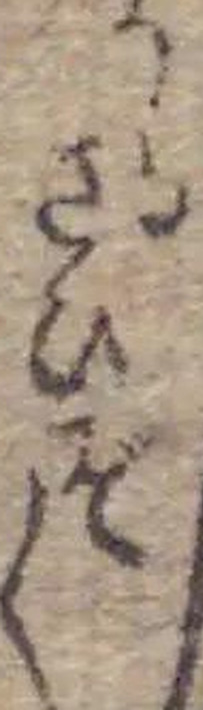さひぞ
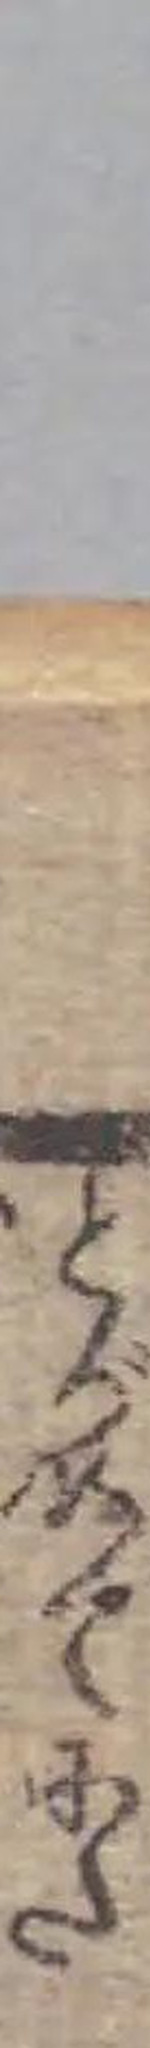とがめてにた
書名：作意妖恐懼感心 2巻
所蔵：国立国会図書館 National Diet Library, JAPAN
